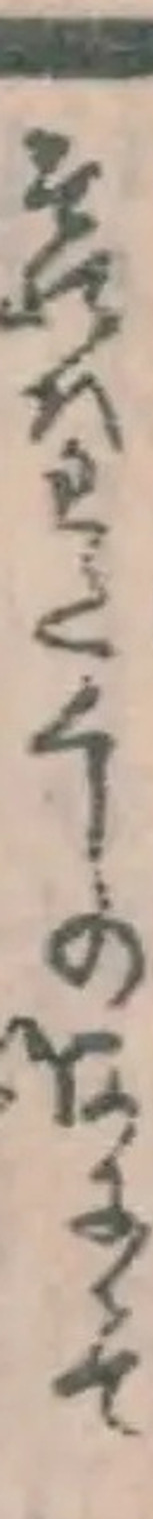それはわたくしのあにゝて
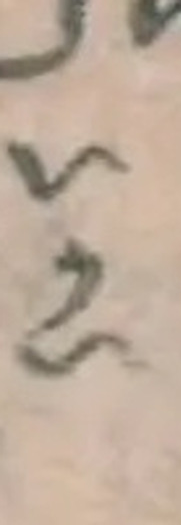いかい
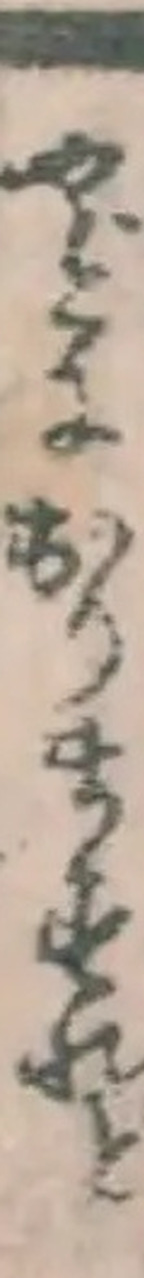やどにおりますれど
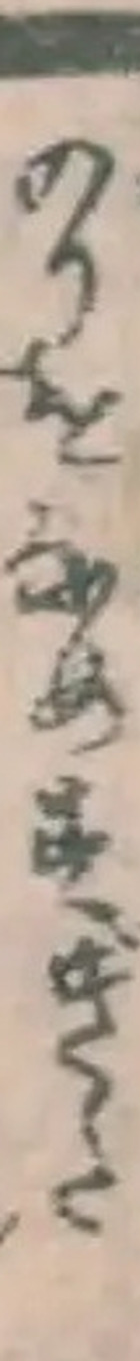のりをなめすぎた
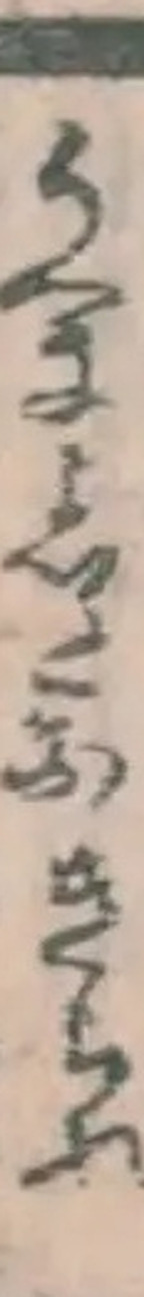うへにしたおきられ
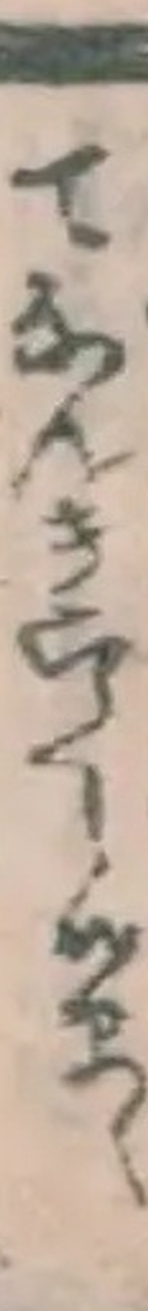てなんきいたし候早々
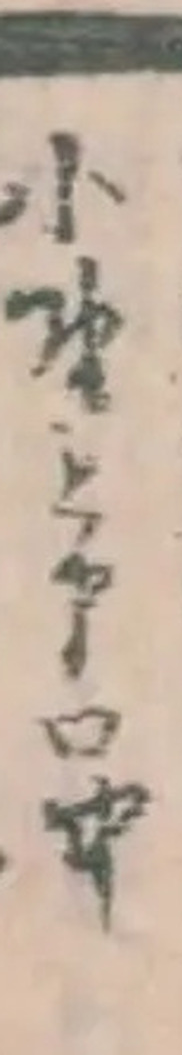小野と申口中
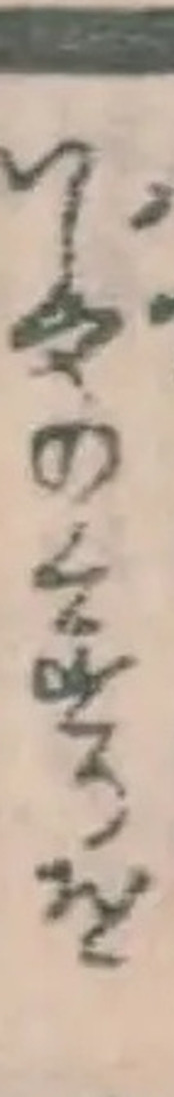いしやのくすりを
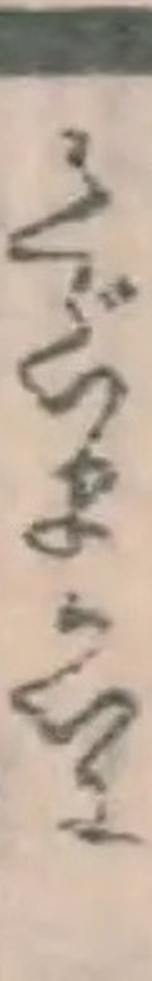たゞいまかいに
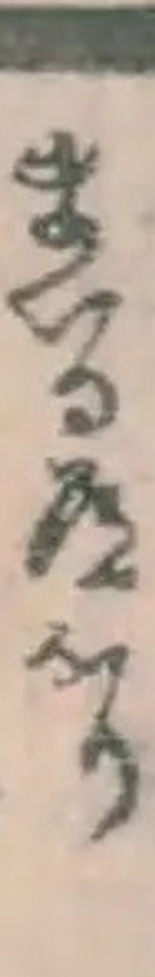まいる道なり
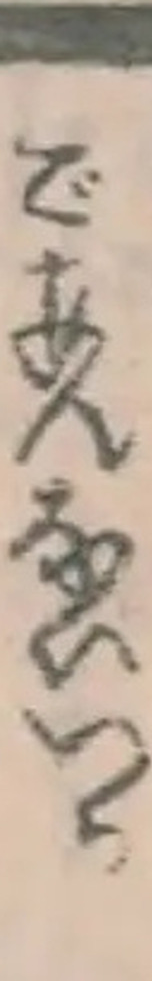ごあんないつか
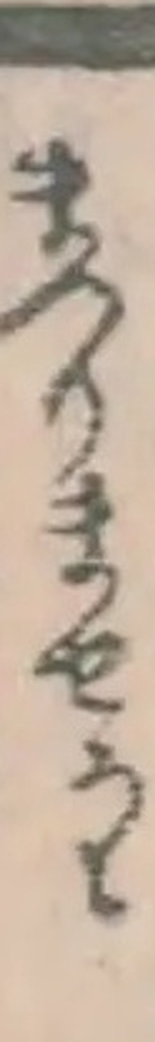まつりませうと
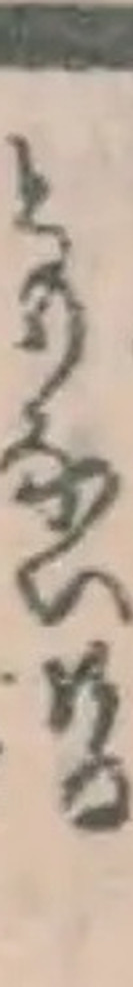ともないける
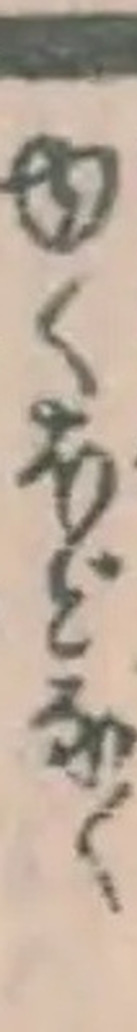ゆくほどなく
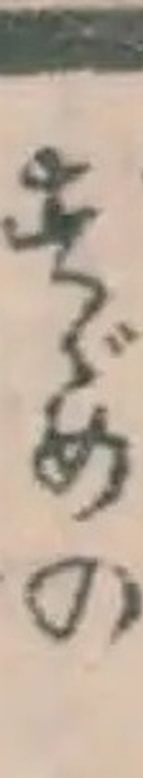すゞめの
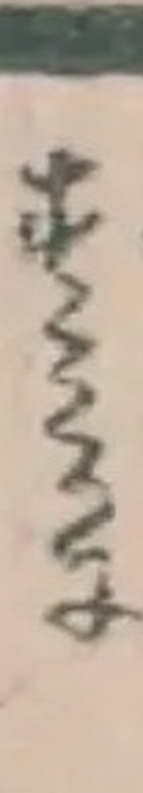すみかに
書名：舌切雀
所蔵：国立国会図書館 National Diet Library, JAPAN
